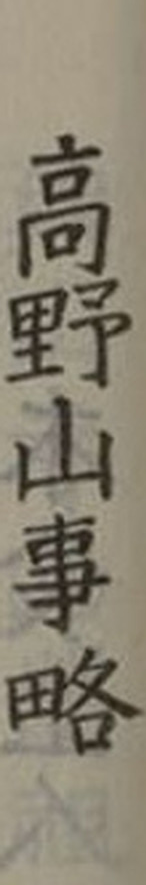高野山事略
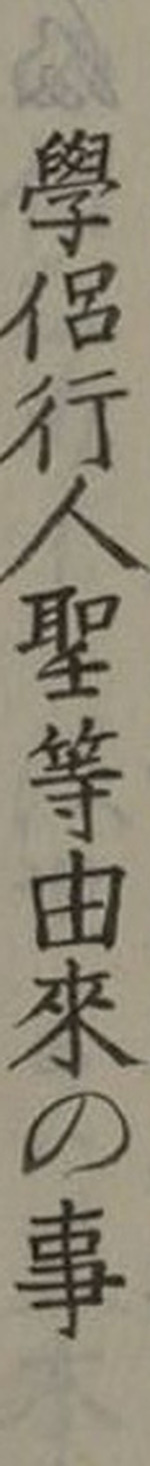學侶行人聖等由來の事
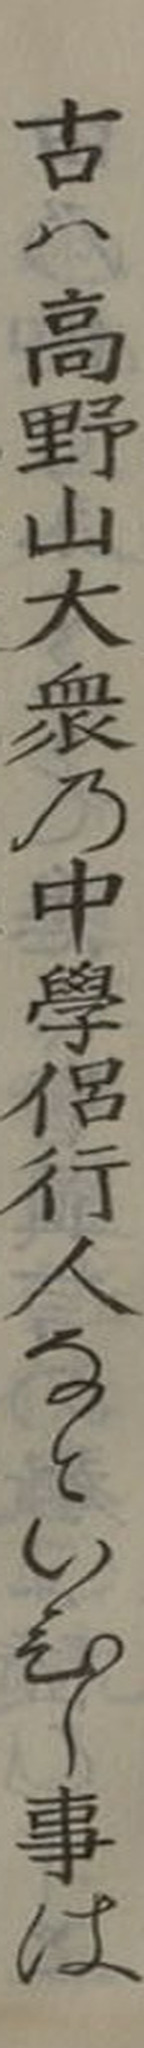古は高野山大衆の中學侶行人なといひし事は
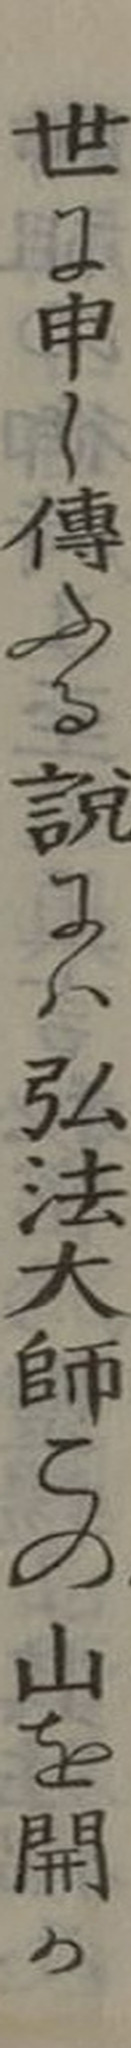世に申し傳ふる説には弘法大師この山を開か
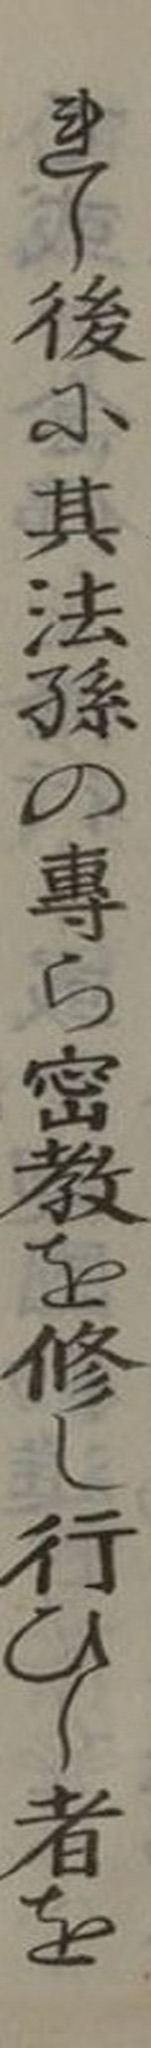れし後に其法孫の專ら密教を修し行ひし者を
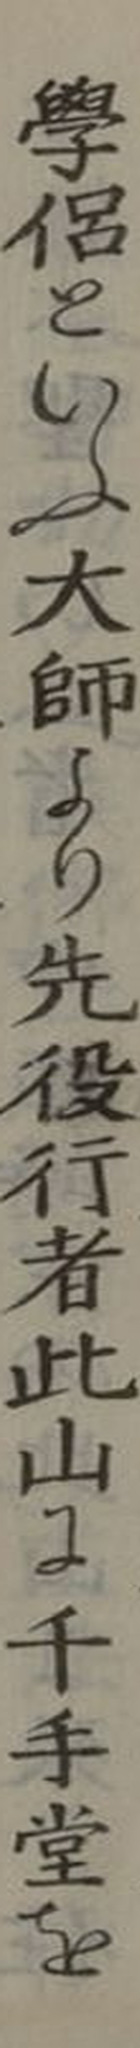學侶といふ大師より先役行者此山に千手堂を
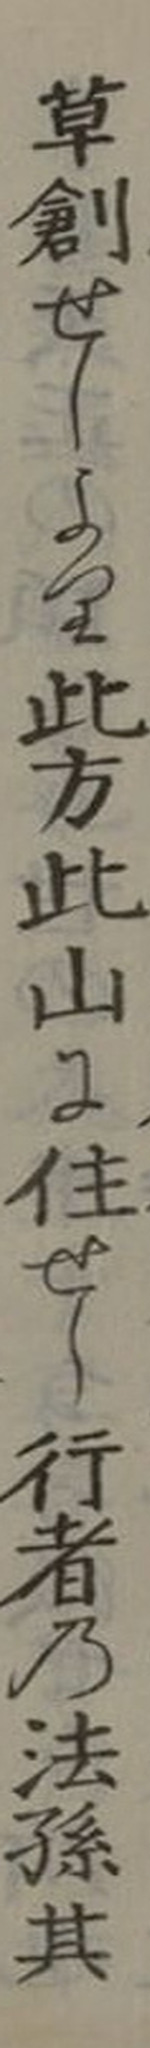草創せしより此方此山に住せし行者の法孫其
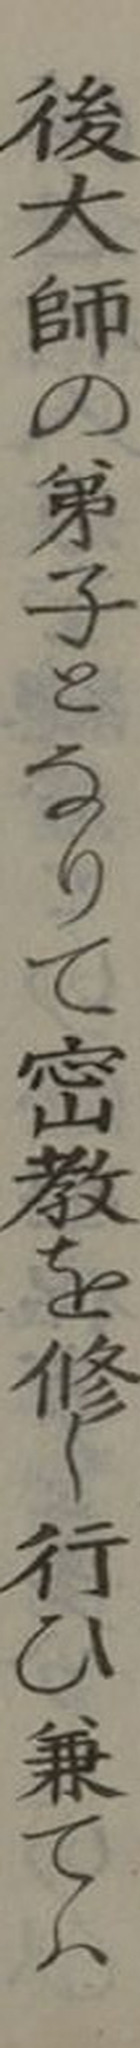後大師の弟子となりて密教を修し行ひ兼ては
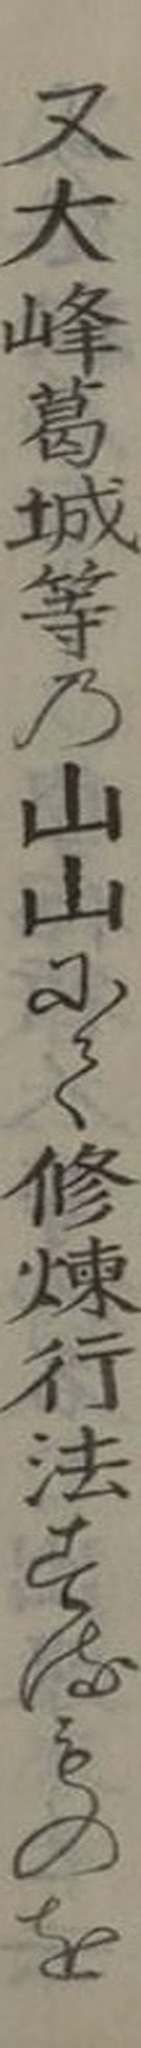又大峰葛城等の山山にて修煉行法するものを
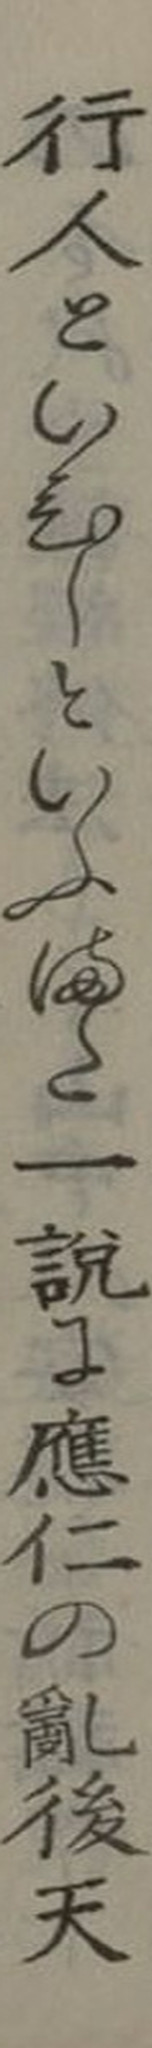行人といひしといふまた一說に應仁の亂後天
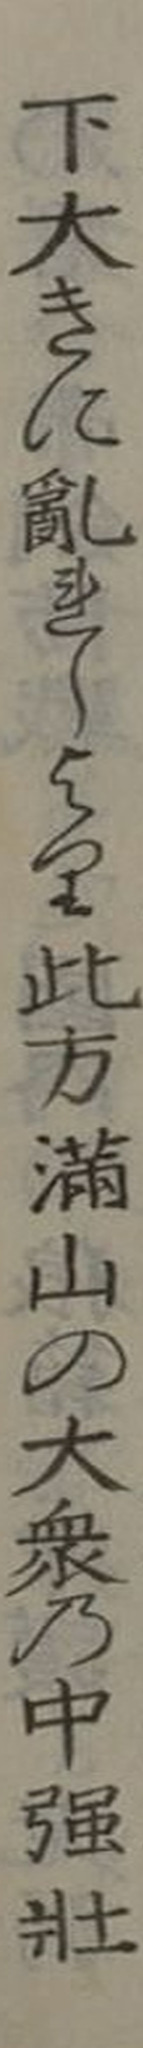下大きに亂れしより此方滿山の大衆の中強壮

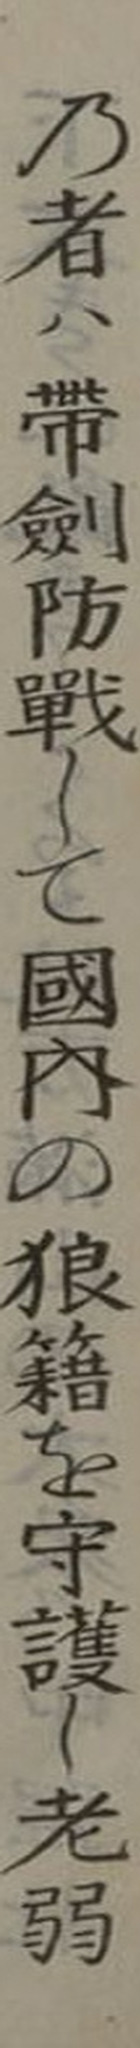の者は帶劍防戦して國内の狼籍を守護し老弱
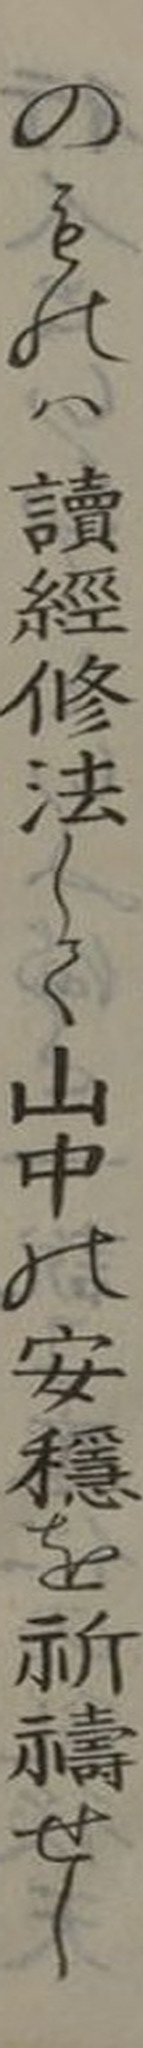のものは讀經修法して山中の安穏を祈禱せし
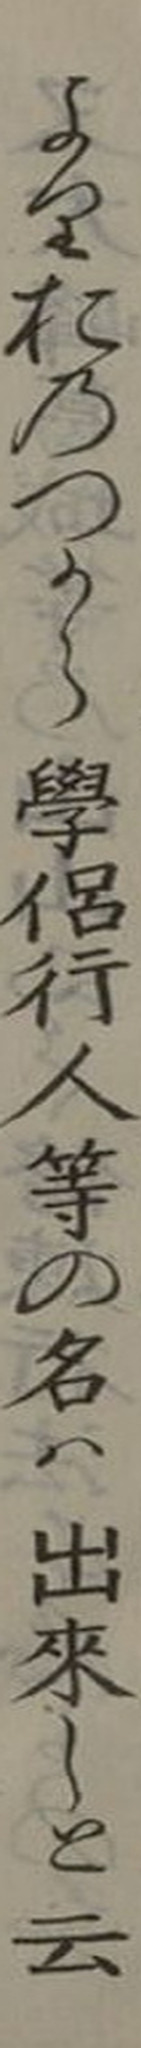よりおのつから學侶行人等の名は出來しと云
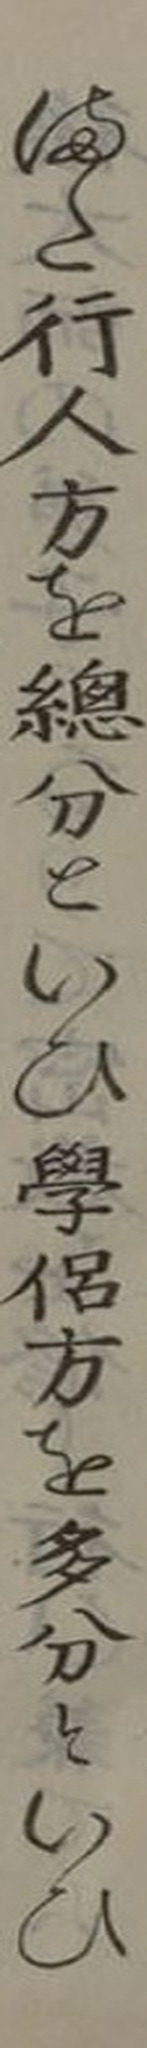また行人方を總分といひ學侶方を多分といひ
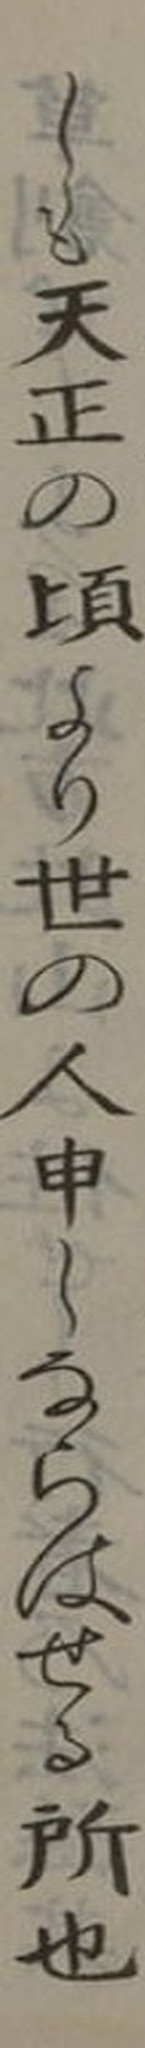しも天正の頃より世の人申しならはせる所也
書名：骨董録
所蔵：University of the Ryukyus Library
